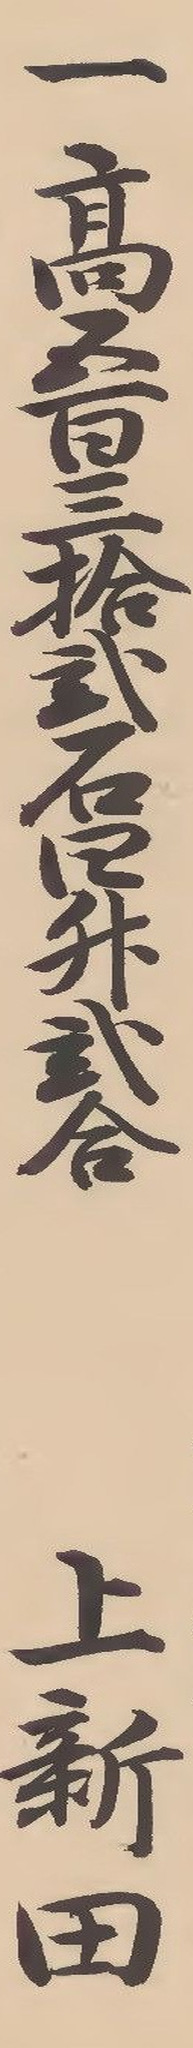一高五百三拾弐石四升弐合上新田
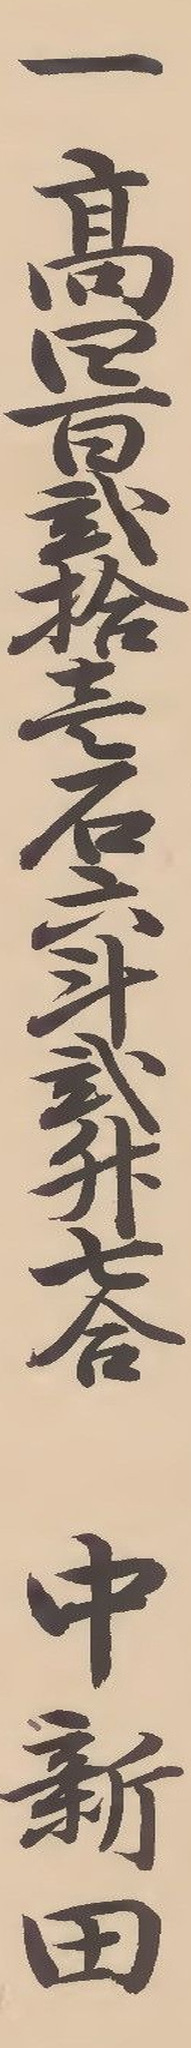一高四百弐拾壱石六斗弐升七合中新田
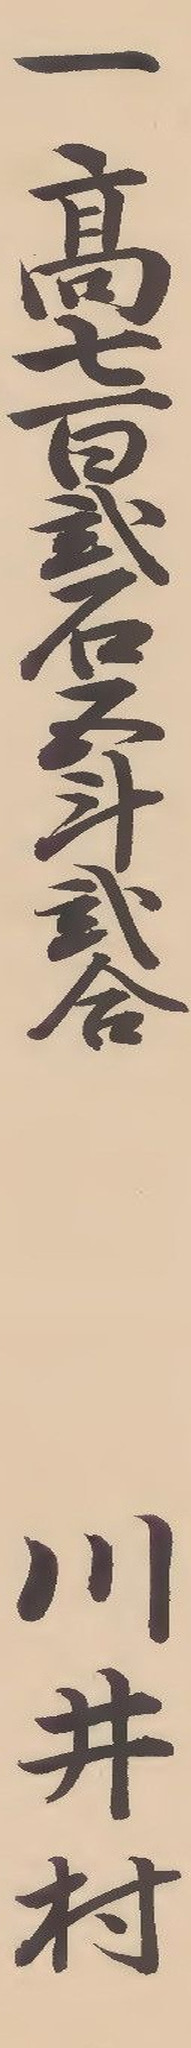一高七百弐石五斗弐合川井村
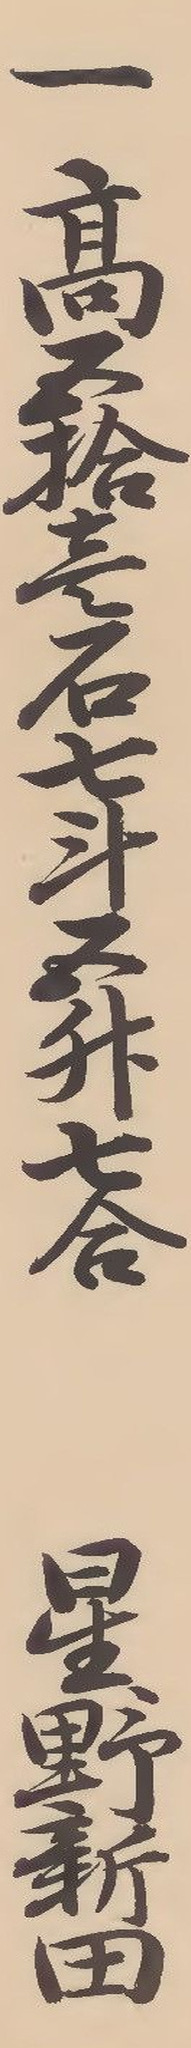一高五拾壱石七斗五升七合星野新田
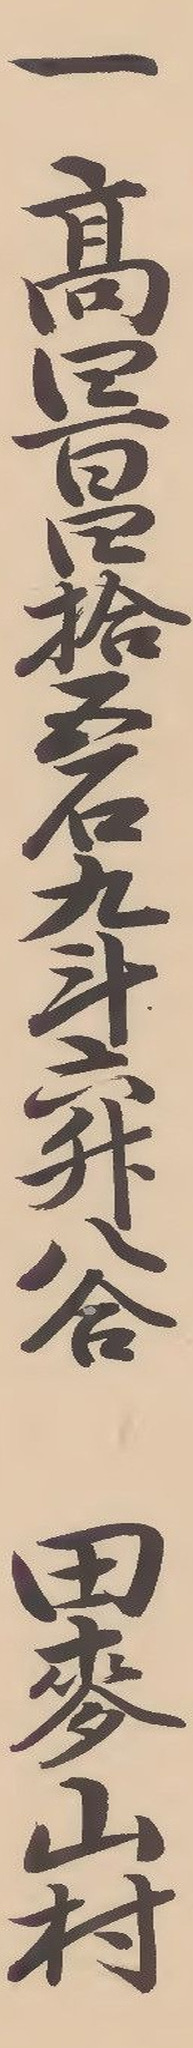一高四百四拾五石九斗六升八合田麦山村

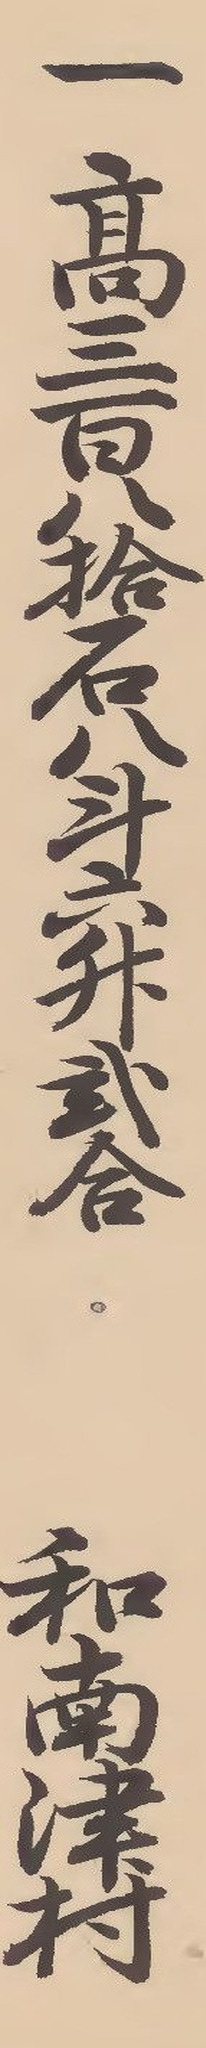一高三百八拾石八斗六升弐合和南津村
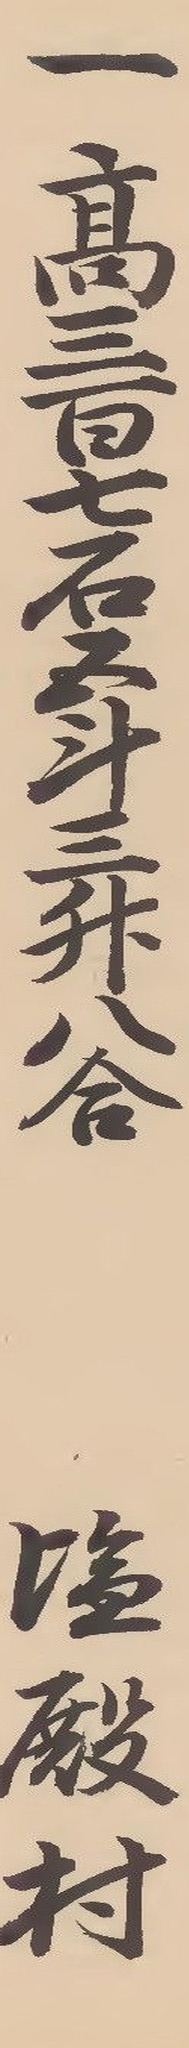一高三百七石五斗三升八合塩殿村
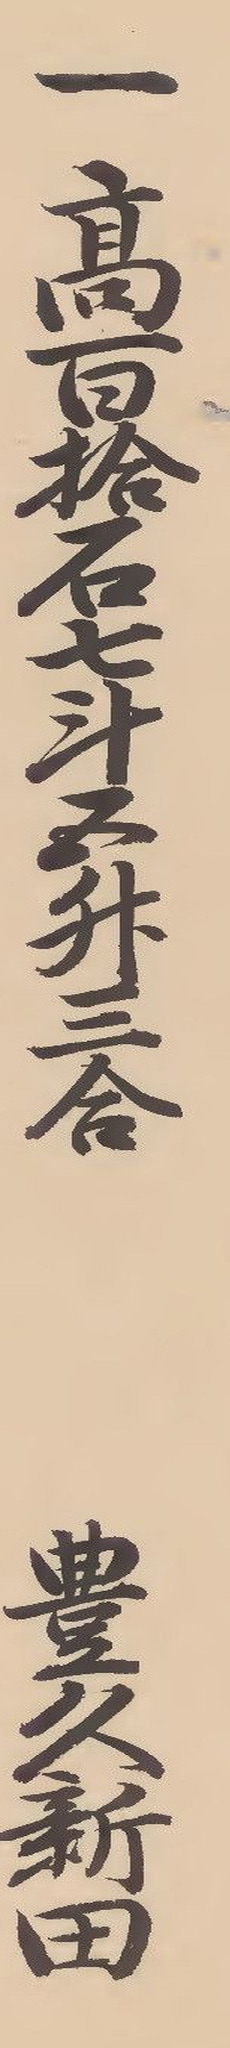一高百拾石七斗五升三合豊久新田
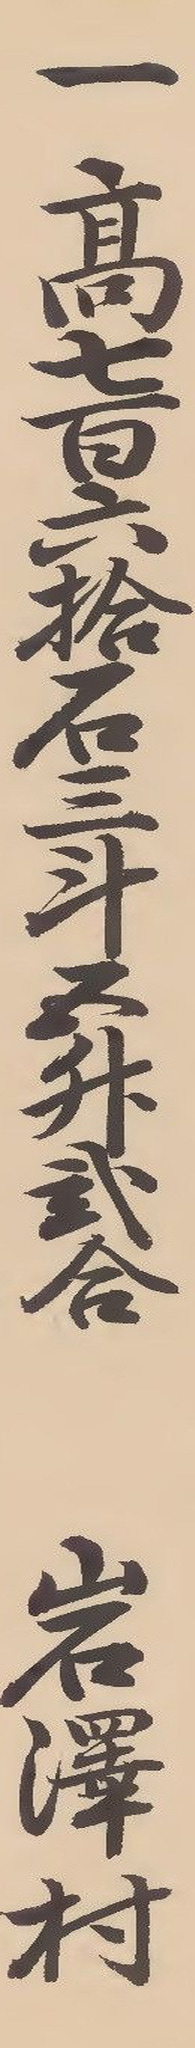一高七百六拾石三斗五升弐合岩沢村
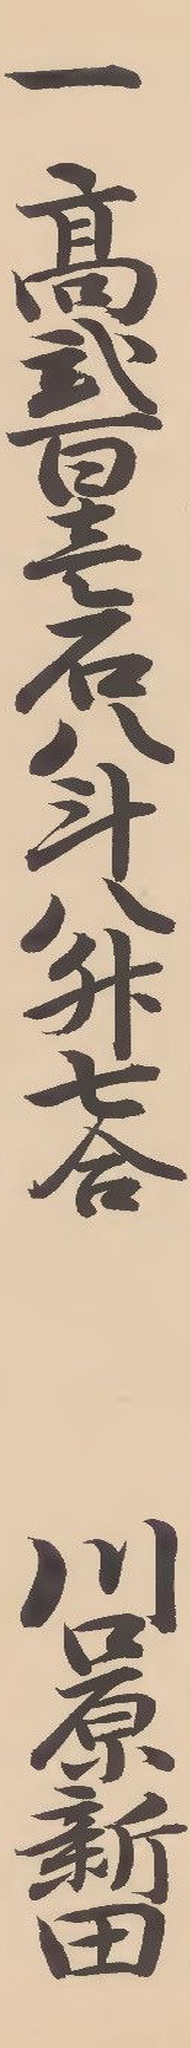一高弐百壱石八斗八升七合川口原新田
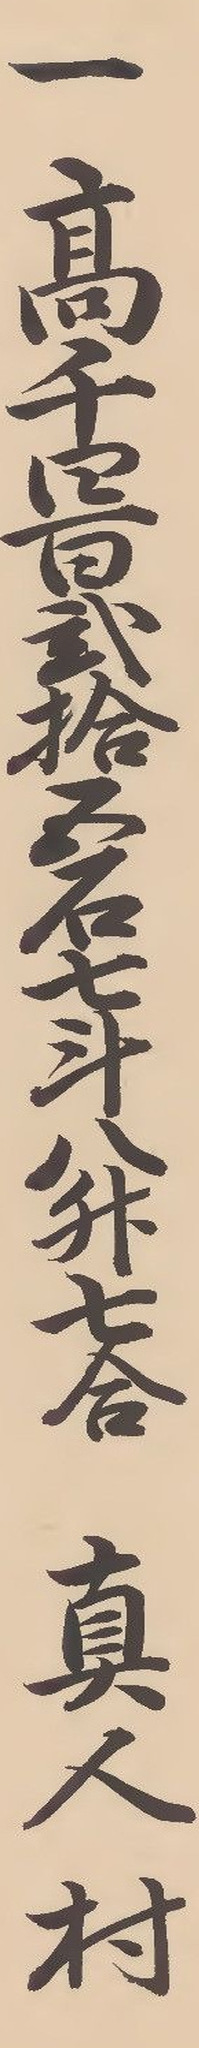一高千四百弐拾五石七斗八升七合真人村
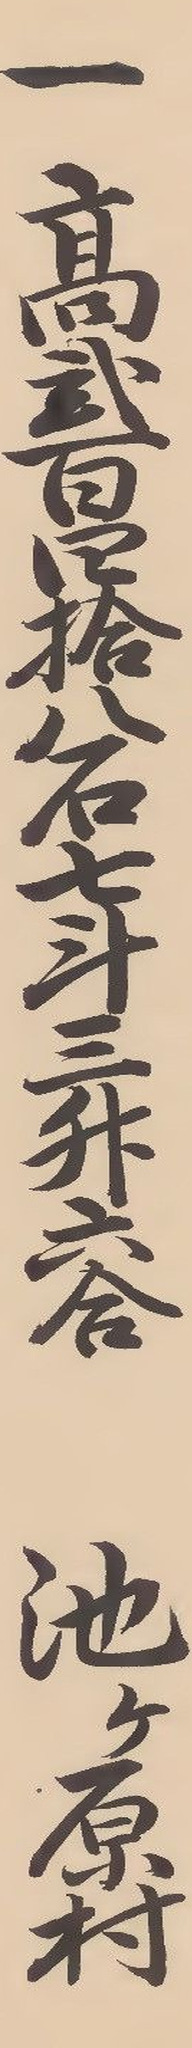一高弐百四拾八石七斗三升六合池ヶ原村
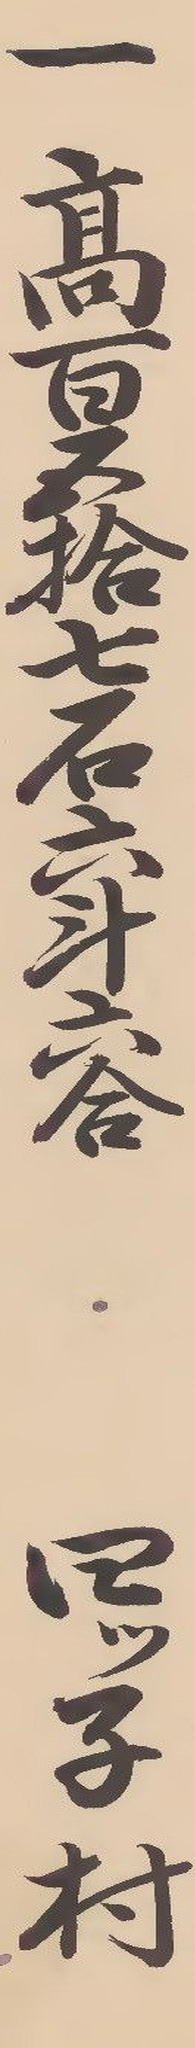一高百五拾七石六斗六合四ッ子村

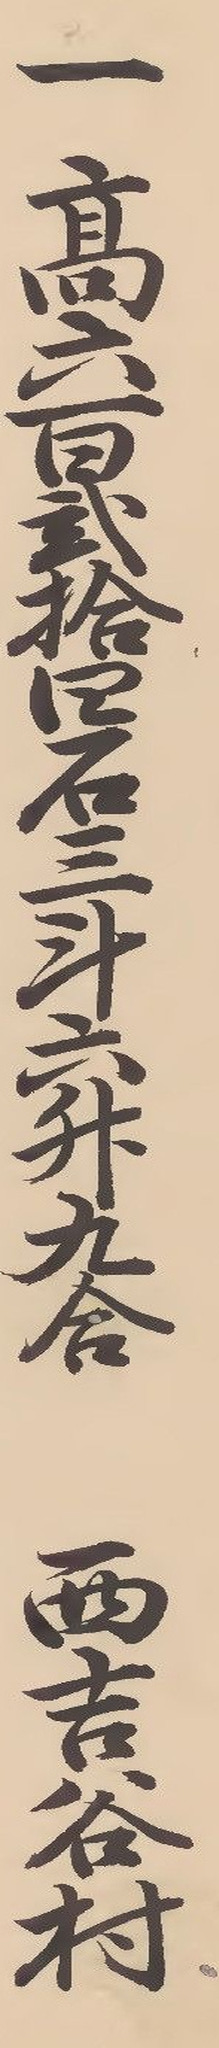一高六百弐拾四石三斗六升九合西吉谷村
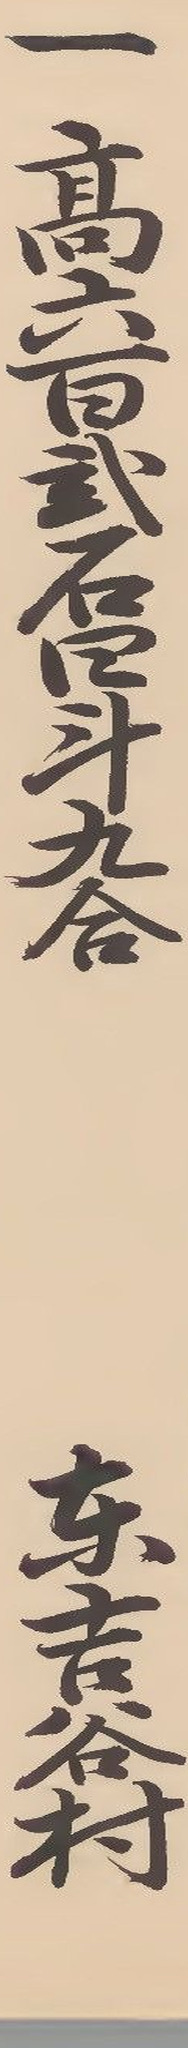一高六百弐石四斗九合東吉谷村
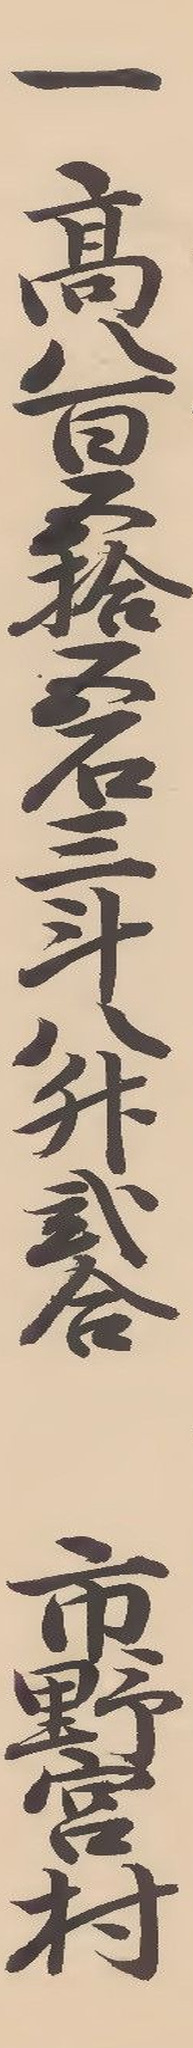一高八百五拾五石三斗八升弐合市野宮村
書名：越後国郷帳　中
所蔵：国立公文書館 National Archives of Japan
